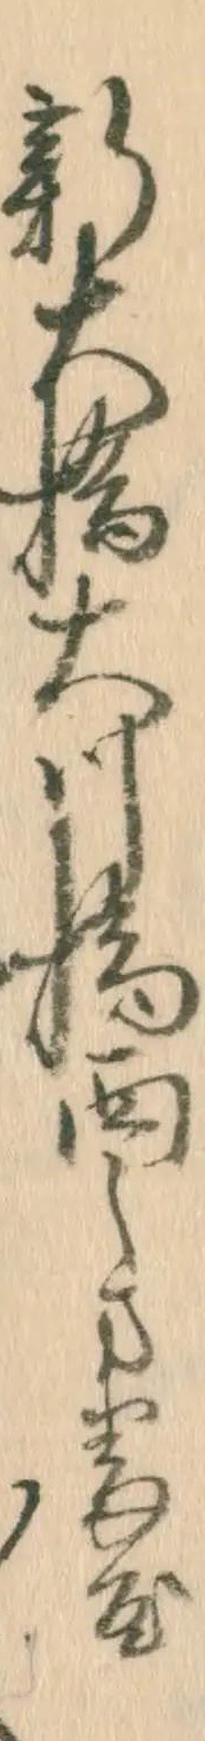新大橋大川橋西之方番屋
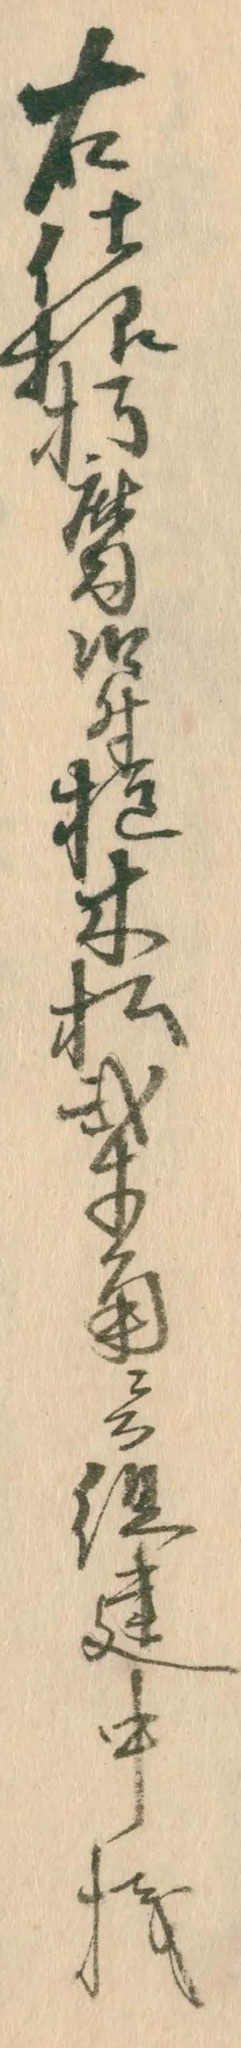右仕様朽腐候付框木松弐寸角ニ而組建中桟

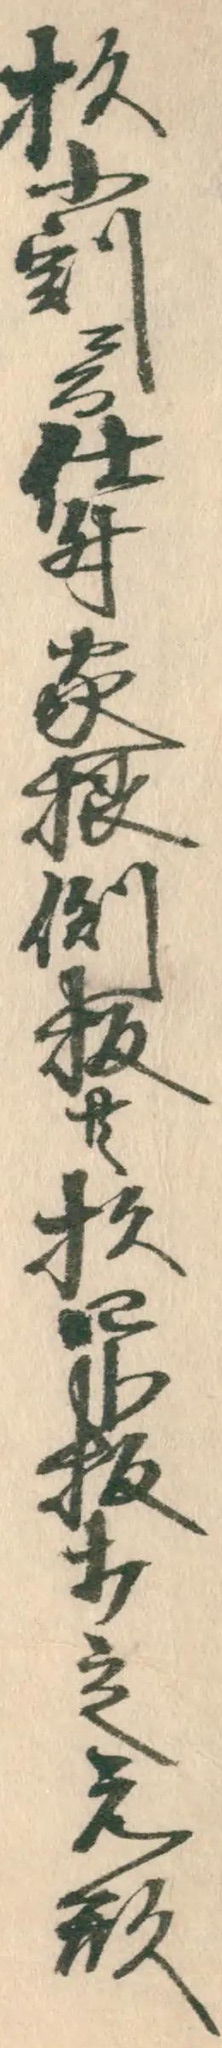杉小割ニ而仕付家根側板共杉四分板打立元形
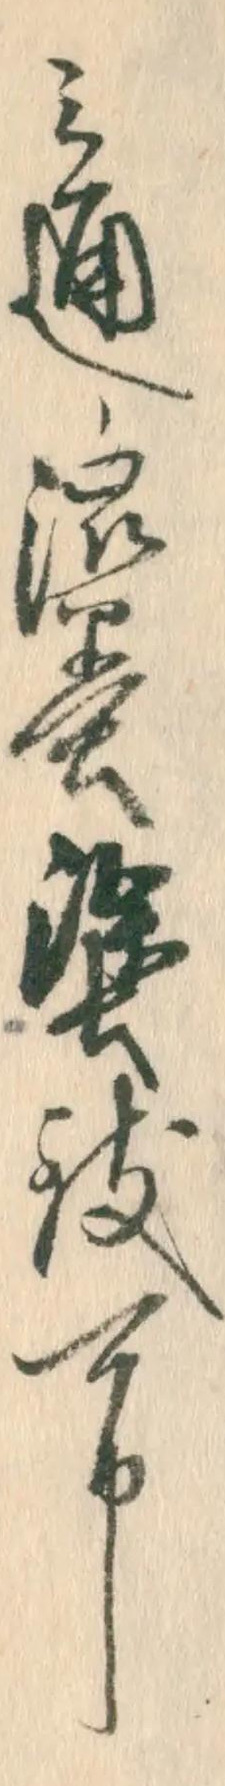之通渋墨塗致可申
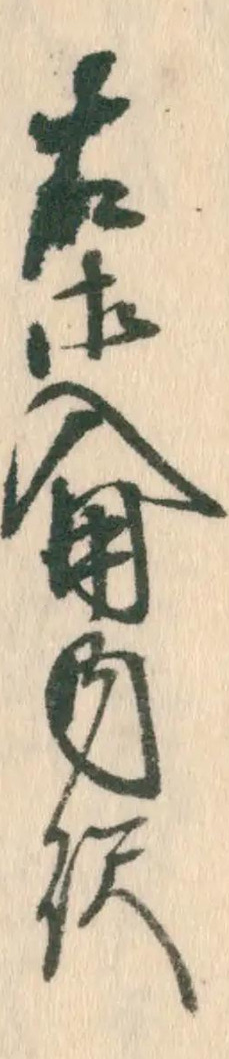右御入用内訳
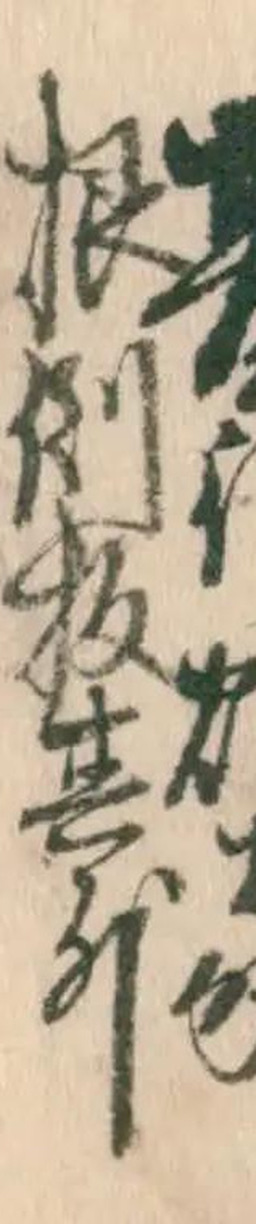根側板其外
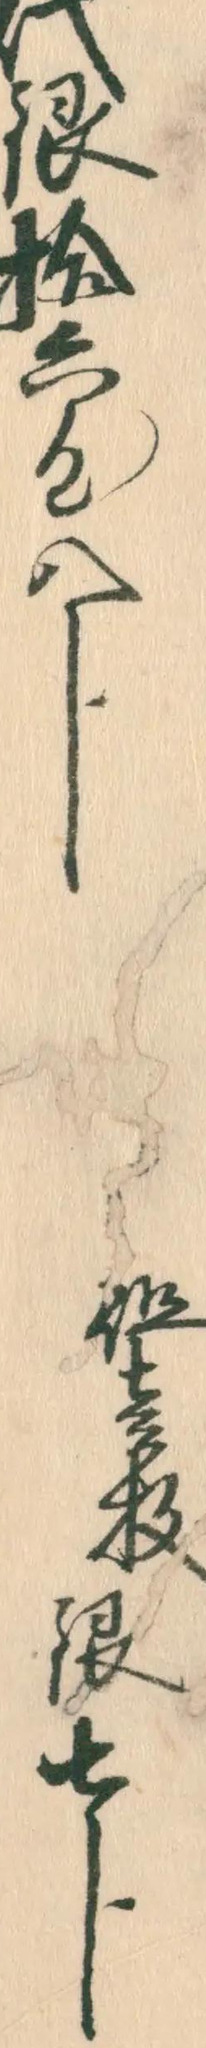代銀拾六匁八分但壱枚銀七分
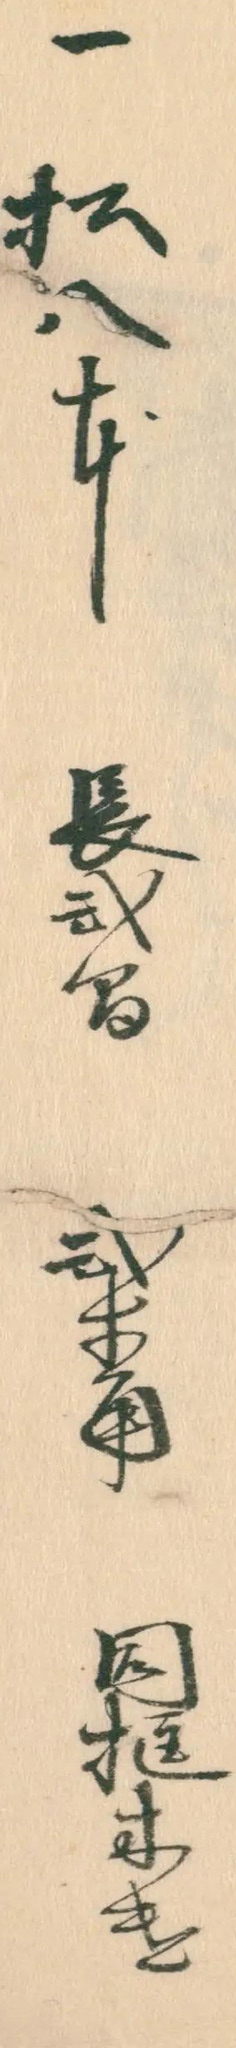一松八本長弐間弐寸角同框木遣
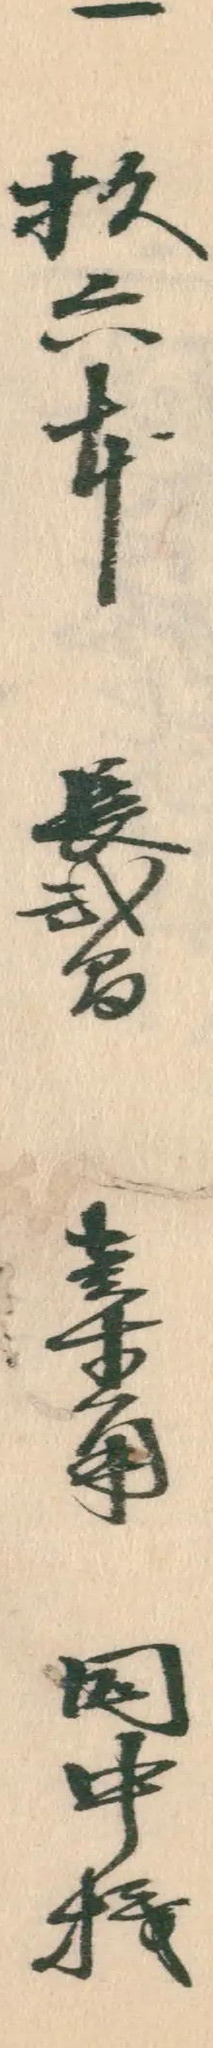一杉六本長弐間壱寸角同中桟
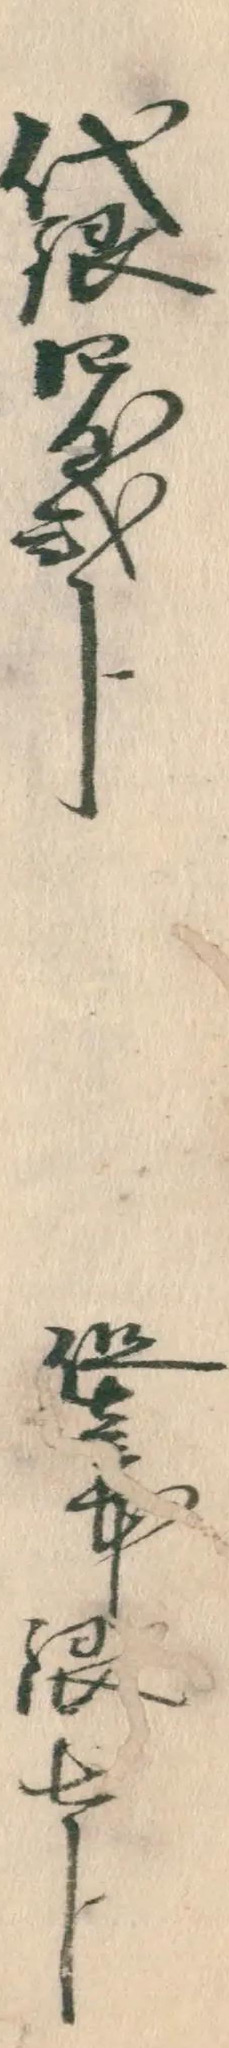代銀四匁弐分但壱本銀七分
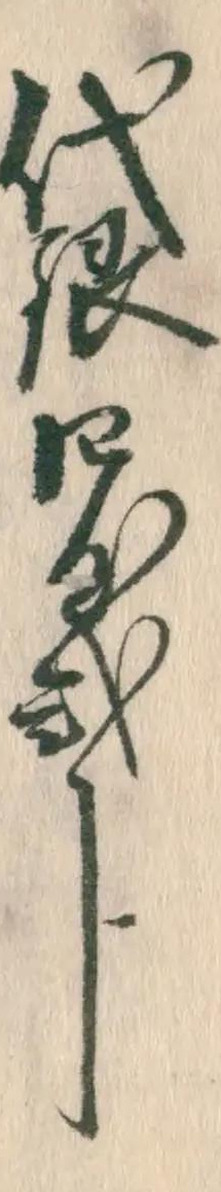代銀七匁五分
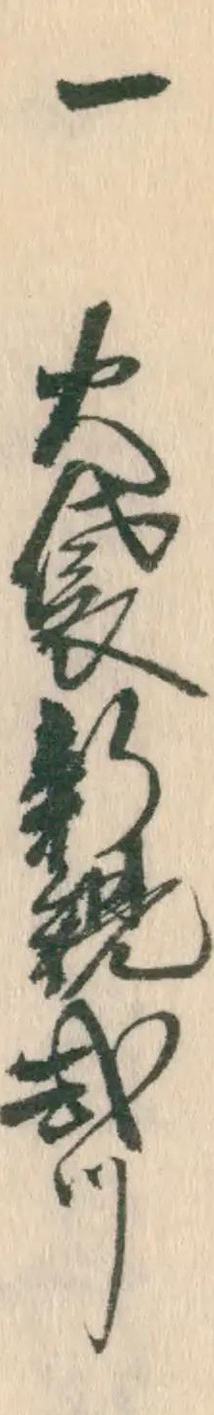一火袋新規弐ツ
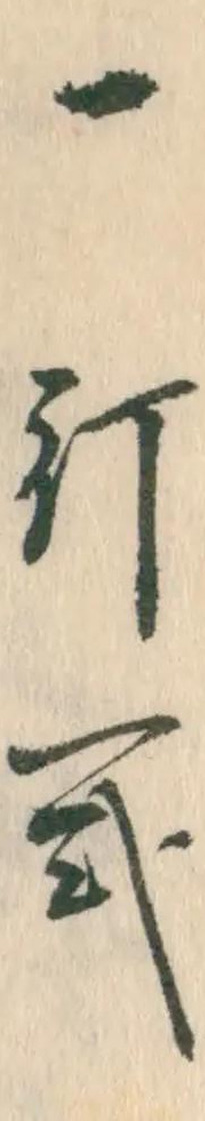一釘一式
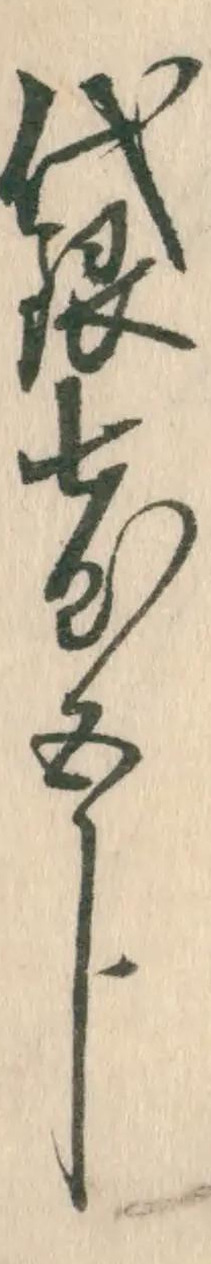代銀七匁五分

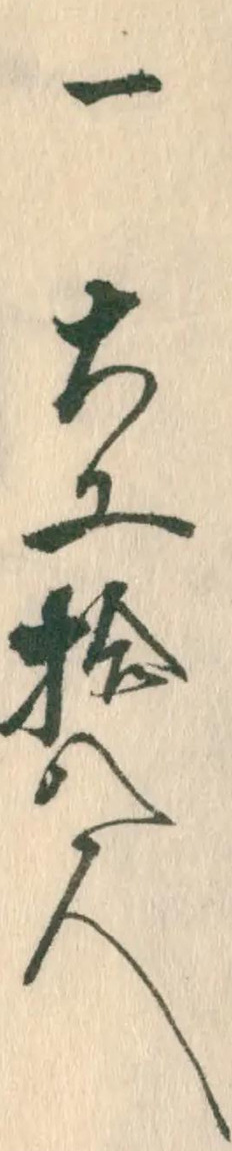一大工拾八人
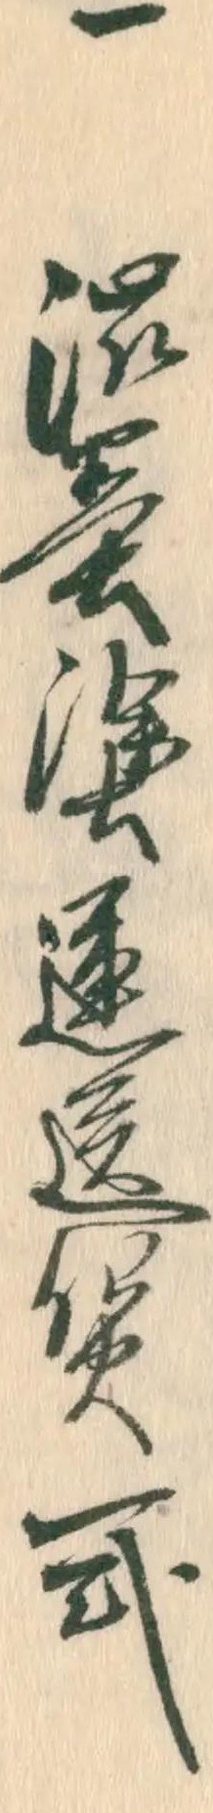一渋墨塗運送賃一式
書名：三橋 17巻. [8] 三橋小破御修復書留　但御奉行御掛リ替地震潰橋番屋　嘉永四亥年より安政二卯年迄　下
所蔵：国立国会図書館 National Diet Library, JAPAN
